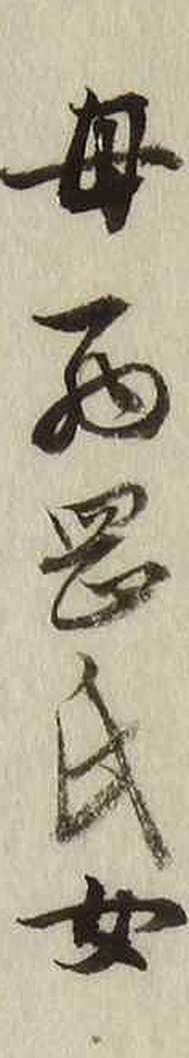母西岡氏女
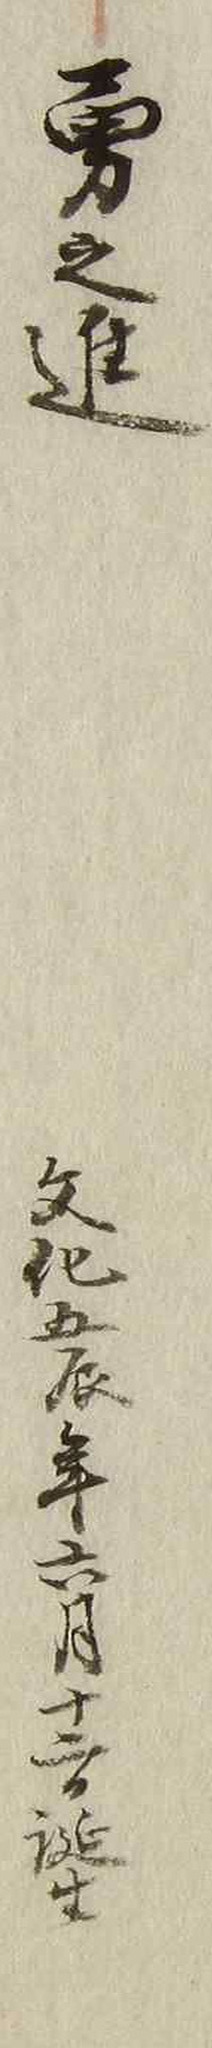勇之進文化五辰年六月十二日誕生
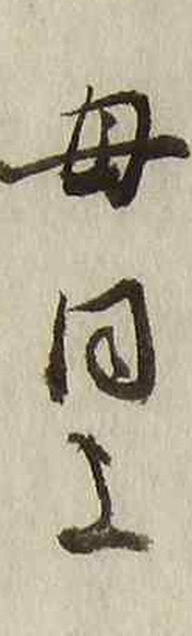母同上
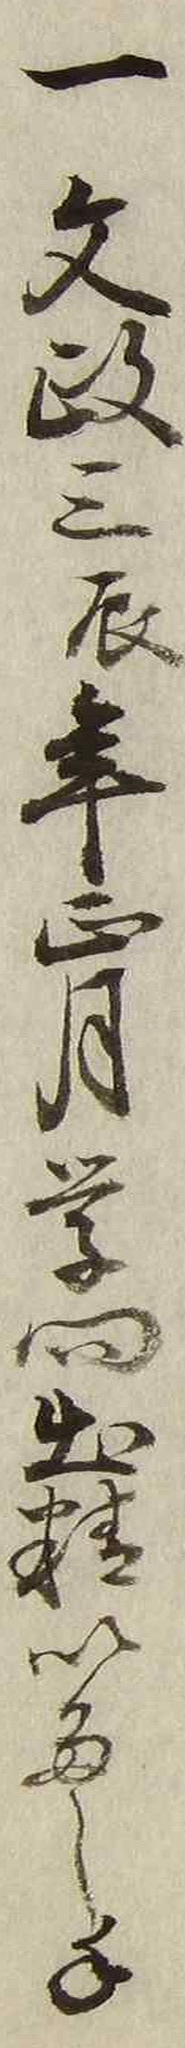一文政三辰年正月学問出精いたし手
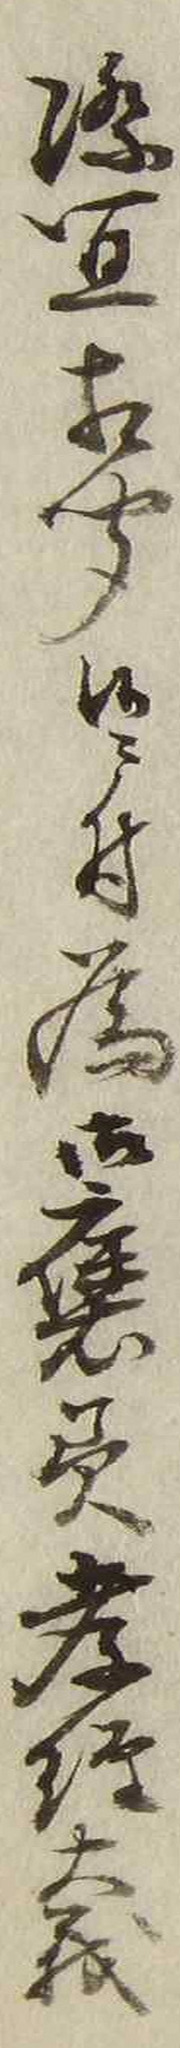際宜相聞候ニ付為御褒美孝経大義

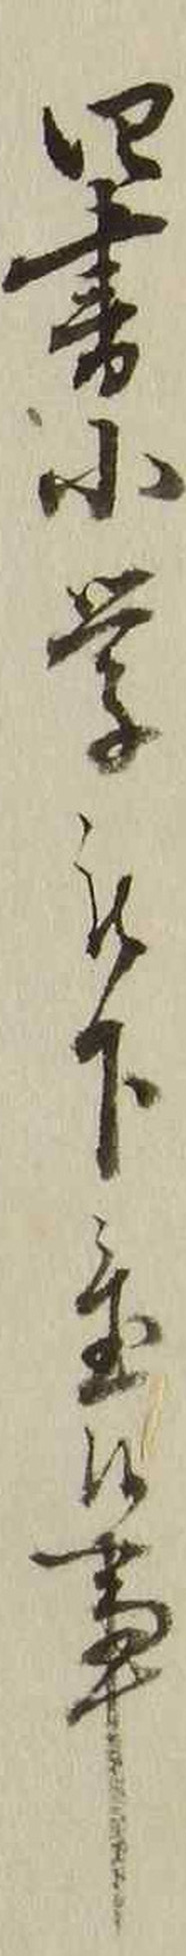四書小学被下置候事
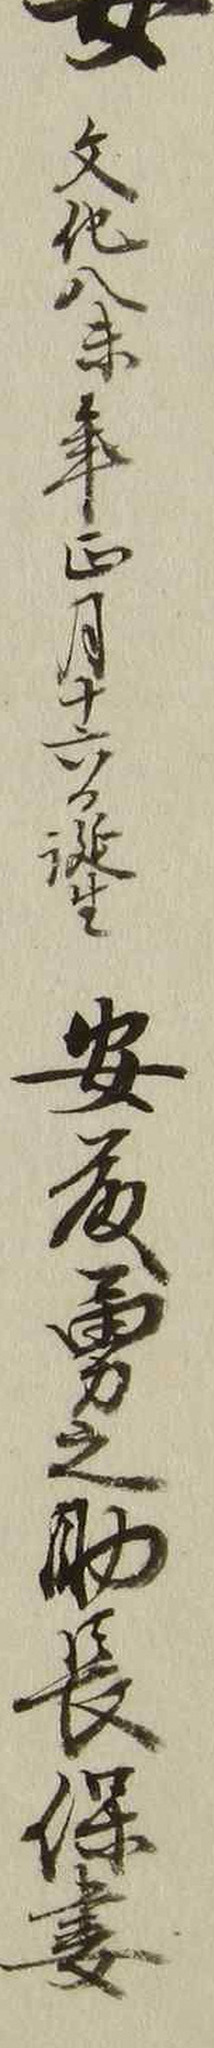女文化八未年正月十六日誕生安藤勇之助長保妻
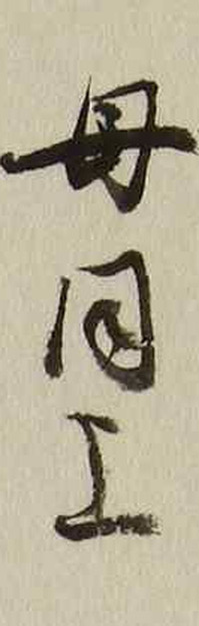母同上
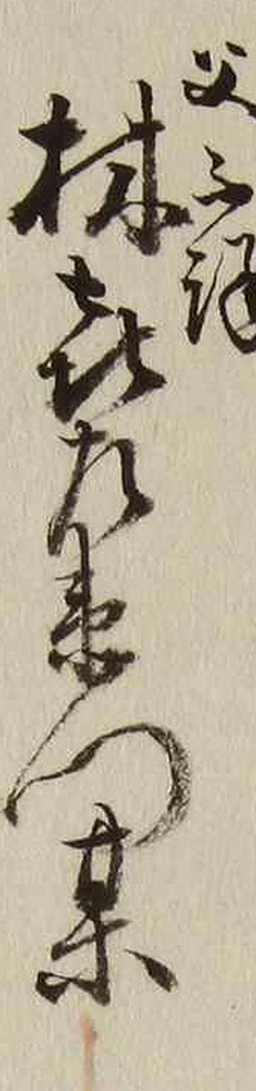林喜左衛門某
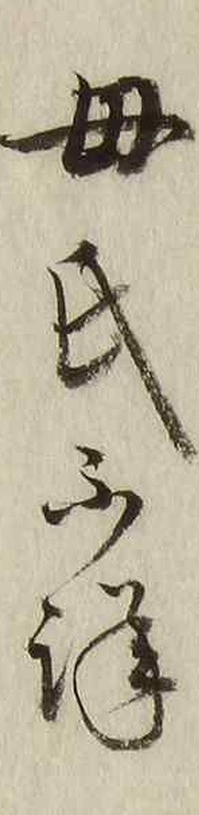母氏不詳
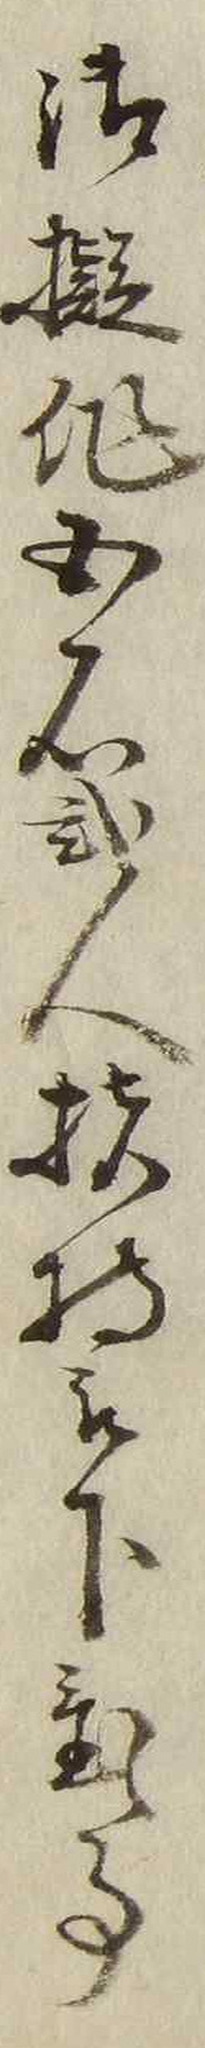御擬作五石弐人扶持被下置候事

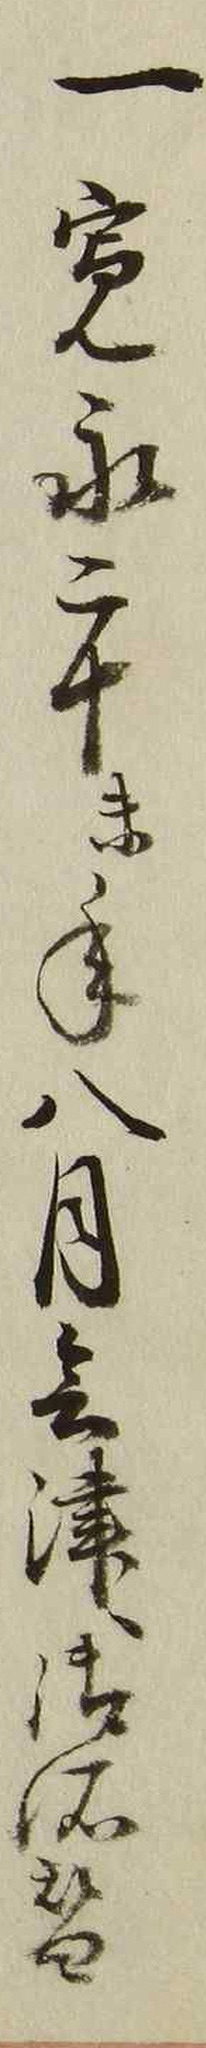一寛永二十未年八月会津へ御所替
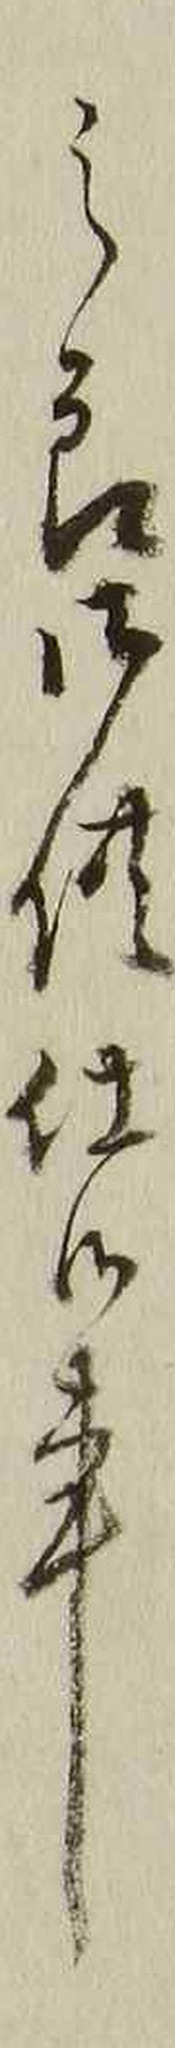之節御供仕候事
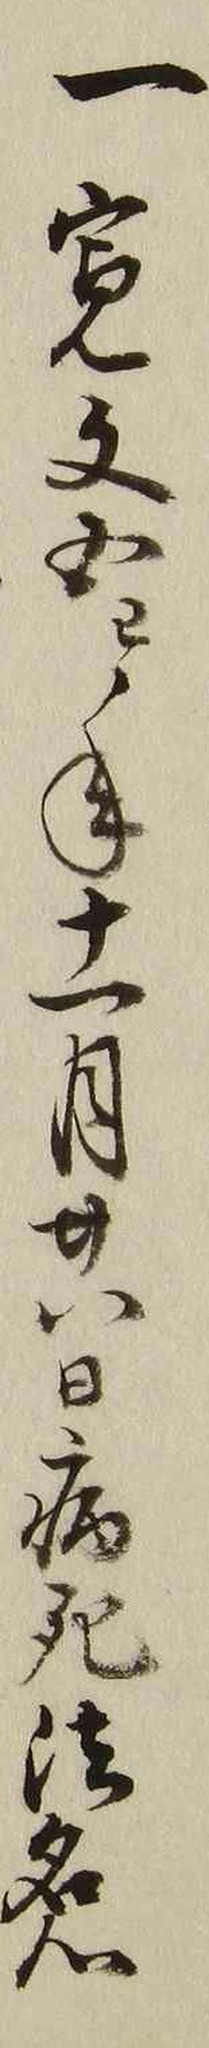一寛文五巳年十一月廿八日病死法名心
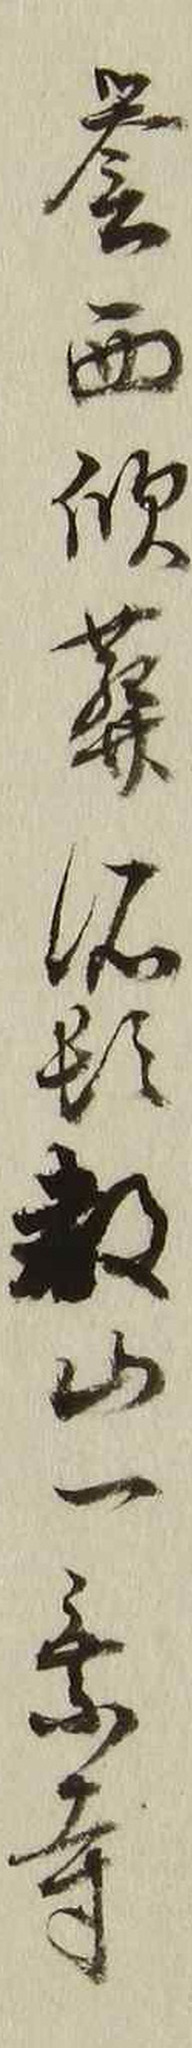誉西欣葬所頓数山一乗寺
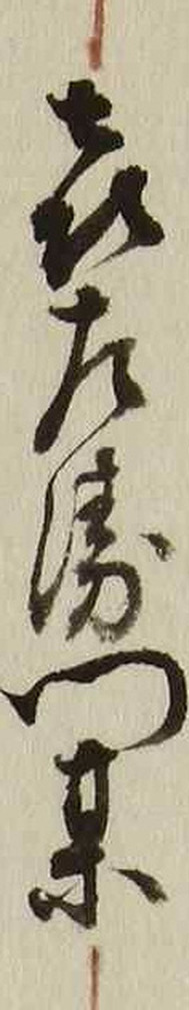喜左衛門某
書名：諸士系譜　巻之36　は之部4
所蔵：会津若松市立会津図書館
